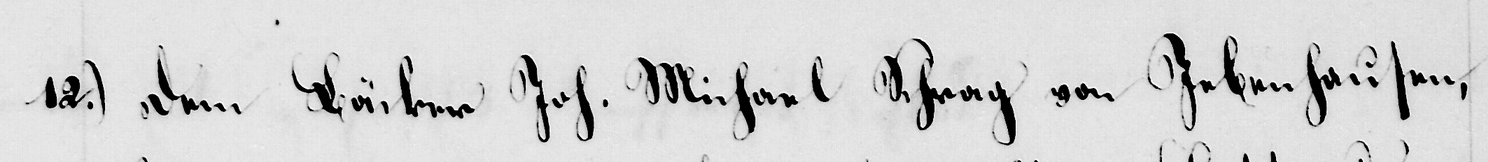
12.) Dem Bäcker Joh. Michael Schrag von Jebenhausen,
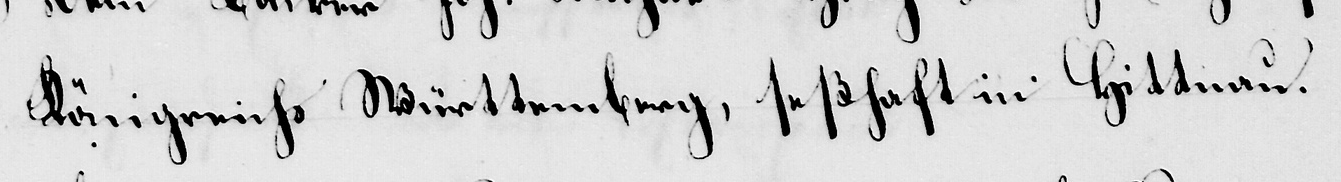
Königreichs Württemberg, seßhaft in Hittnau.
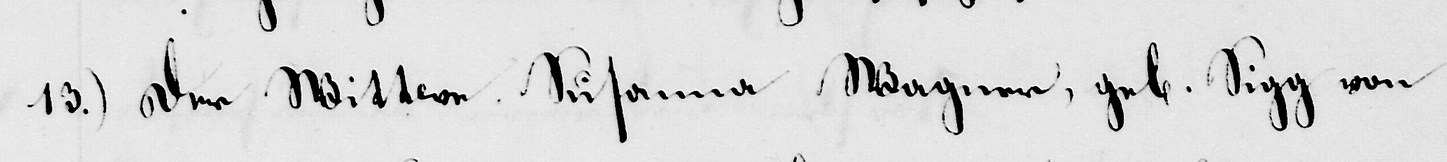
13.) Der Wittwe Susanna Wagner, geb. Sigg von
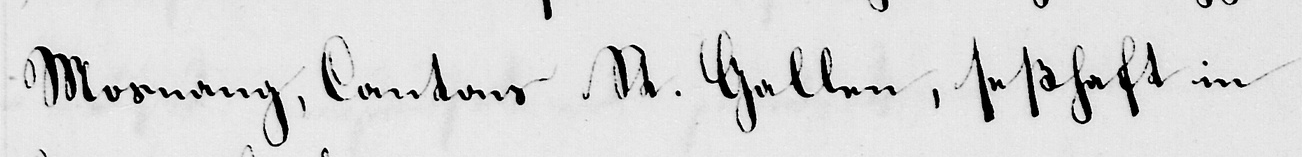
Mosnang, Cantons St. Gallen, seßhaft in
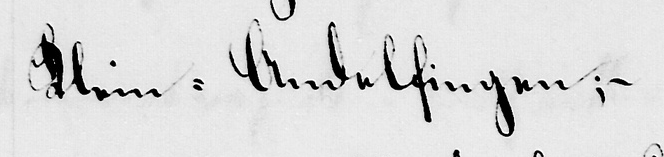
Klein-Andelfingen; –
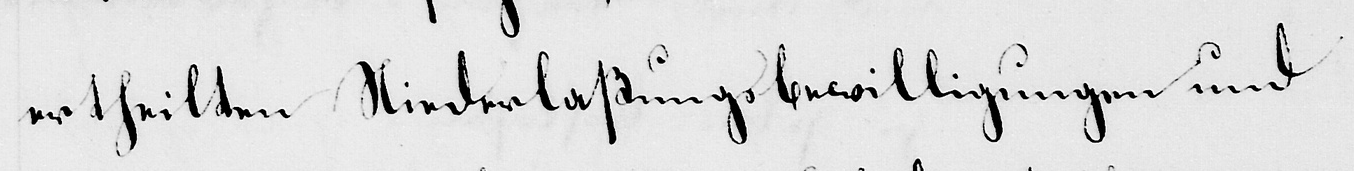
ertheilten Niederlaßungsbewilligungen und
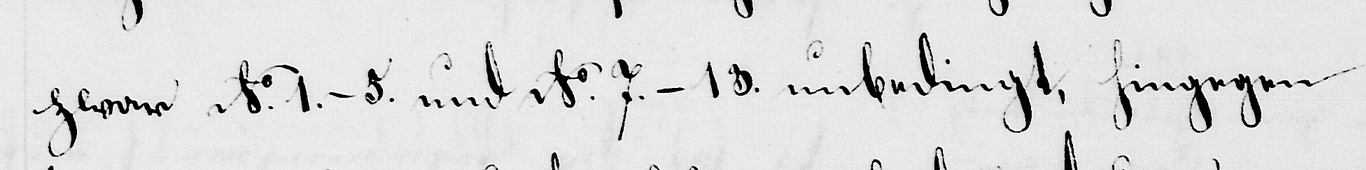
zwar N°. 1.–5. und N°. 7.–13. unbedingt, hingegen
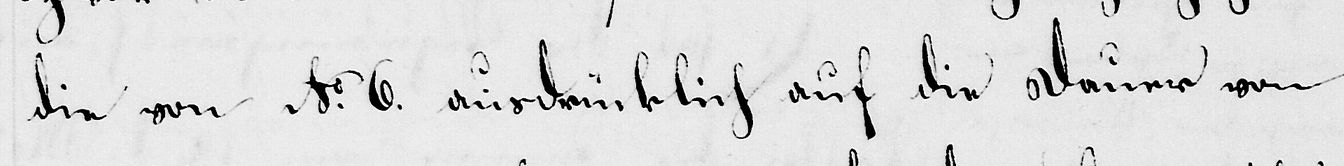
die von N°. 6. ausdrücklich auf die Dauer von
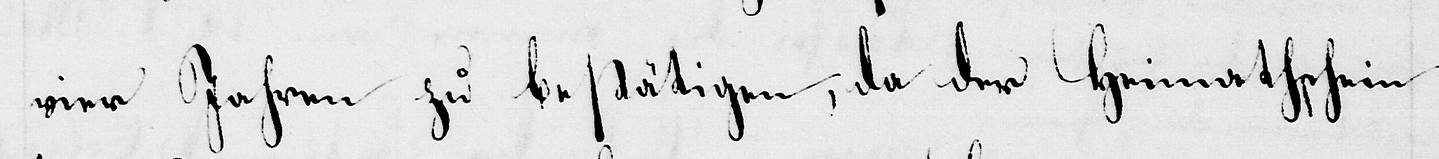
vier Jahren zu bestätigen, da der Heimathschein
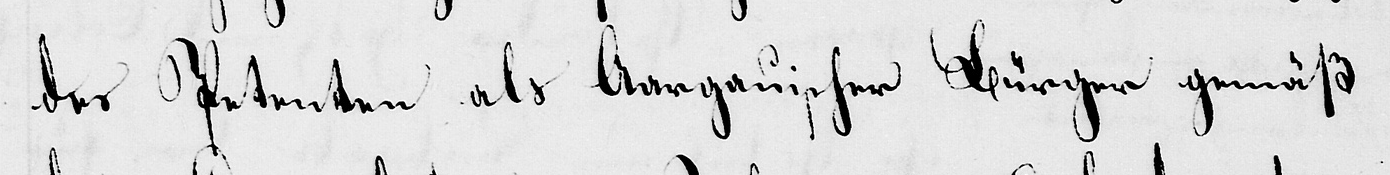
des Petenten als Aargauischer Bürger gemäß
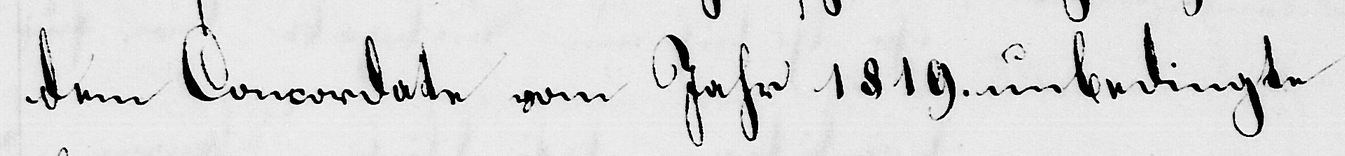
dem Concordate vom Jahr 1819. unbedingte
